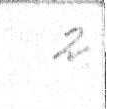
2
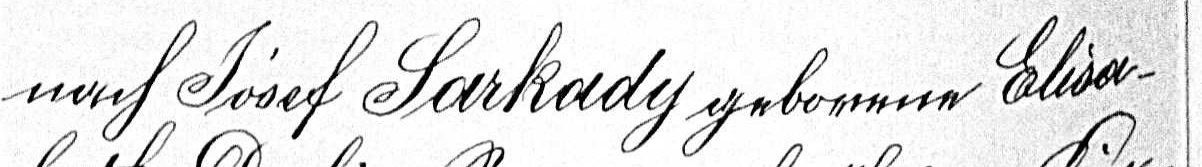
nach Jósef Sarkady geborene Elisa¬
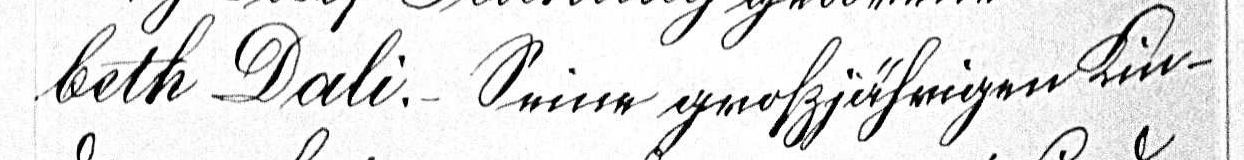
beth Dali. Seine großjährigen Kin¬
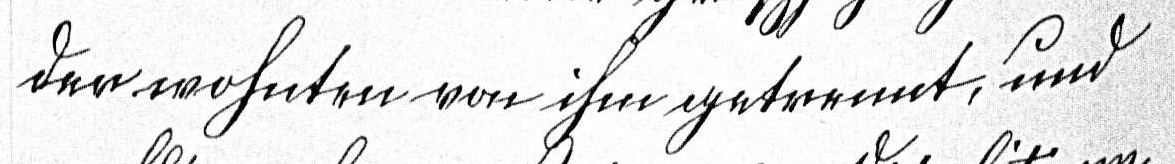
der wohnten von ihm getrennt, und
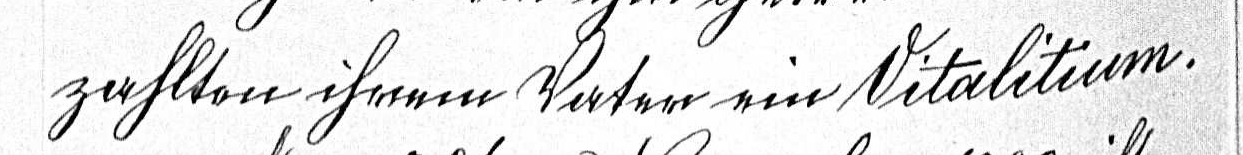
zahlten ihrem Vater ein Vitalitium.
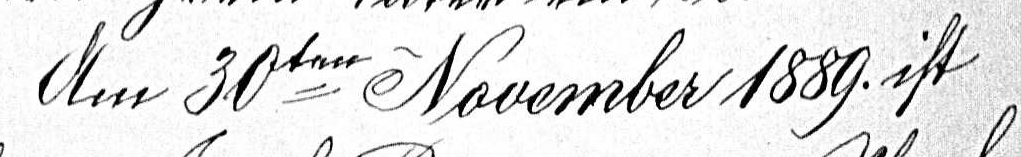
Am 30ter November 1889 ist
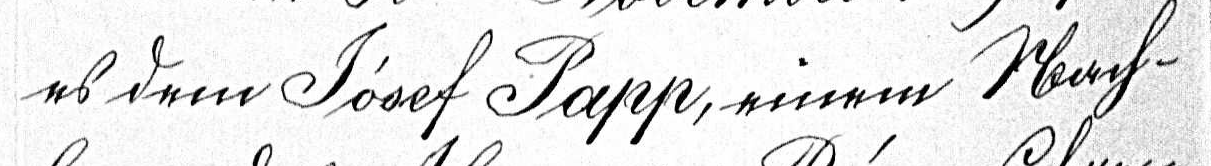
es dem Jósef Papp, einem Nach¬
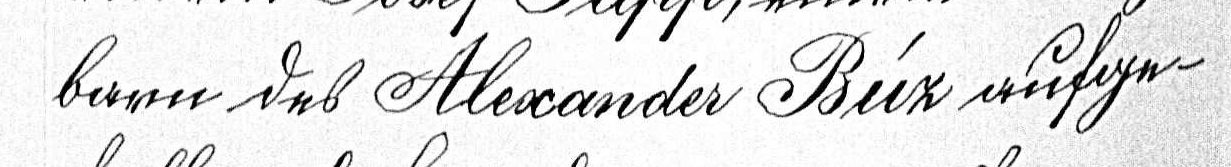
barn des Alexander Búz aufge¬
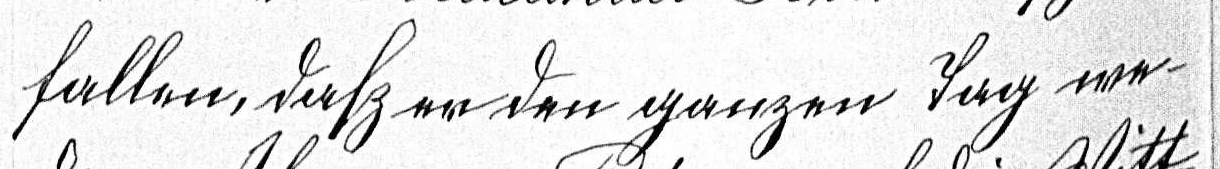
fallen, daß er den ganzen Tag we¬
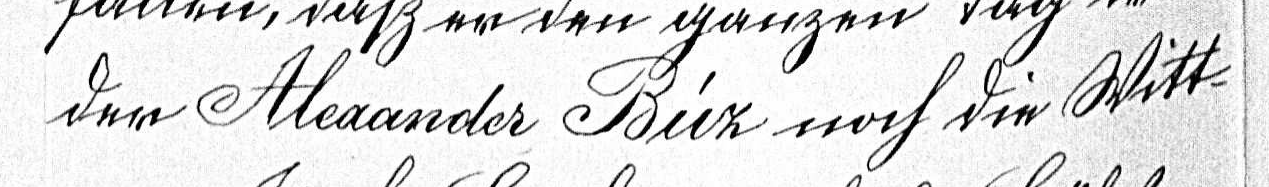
der Alexander Búz noch die Witt¬
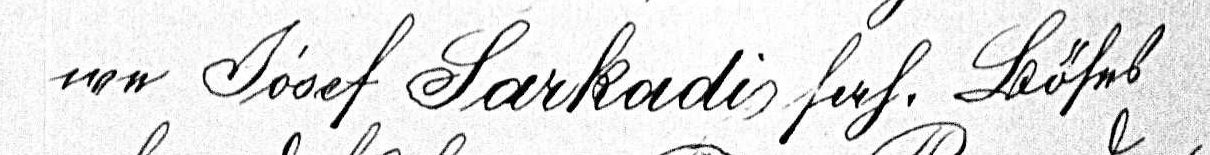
we Jósef Sarkadi sah. Böses
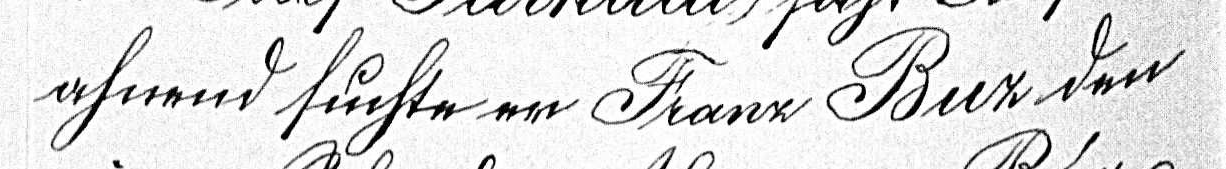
ahnend suchte er Franz Buz den
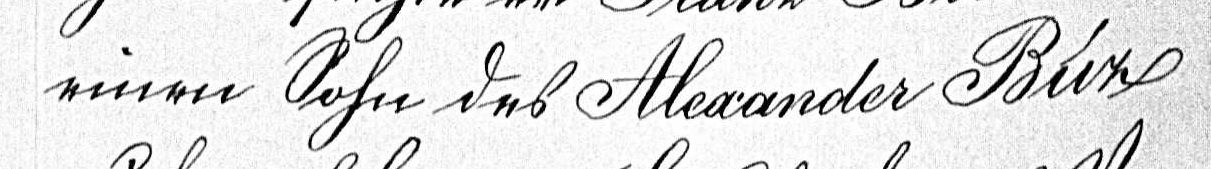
einen Sohn des Alexander Búz
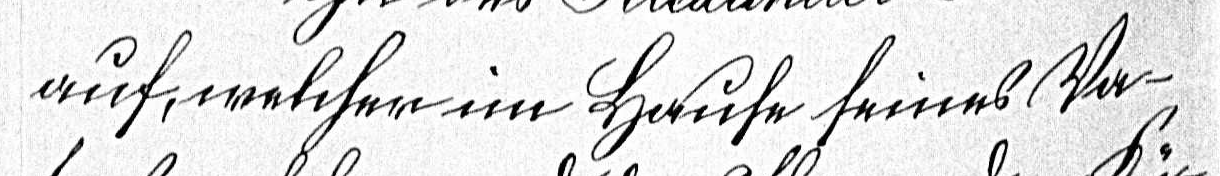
auf, welcher im Hause seines Va¬
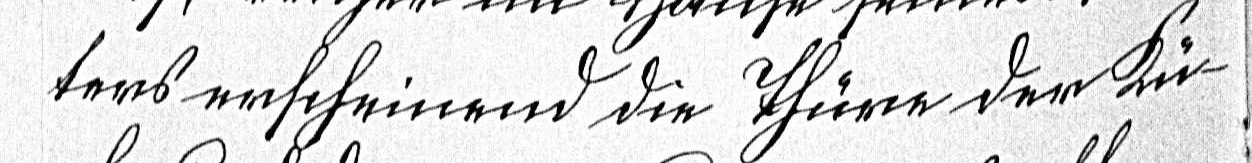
ters erscheinend die Thüre der Kü¬
